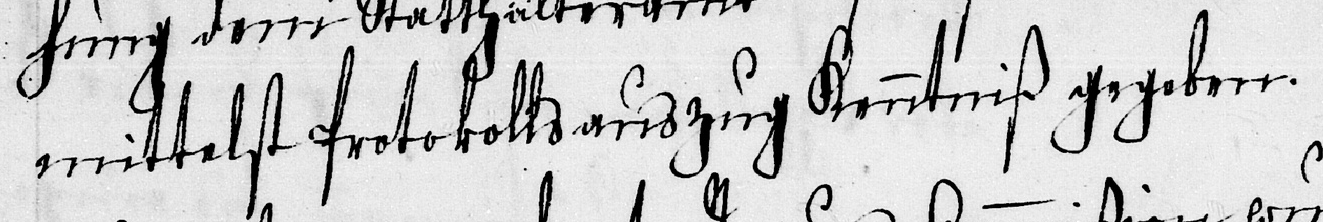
mittelst Protokollsauszug Kenntniß gegeben.
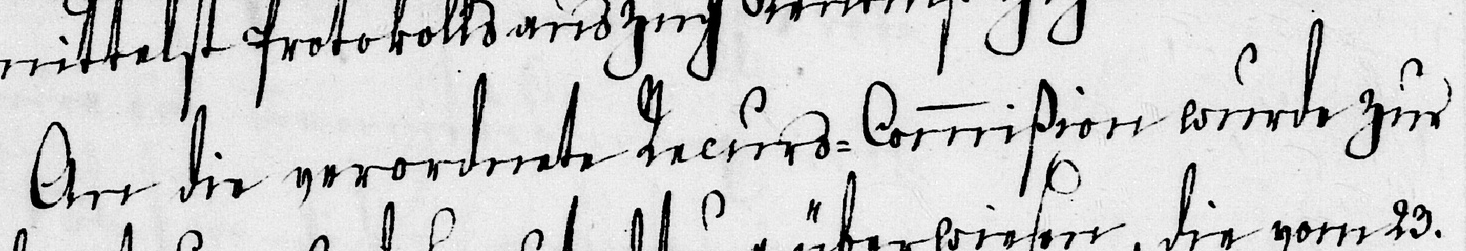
An die verordnete Recurs-Commißion wurde zur
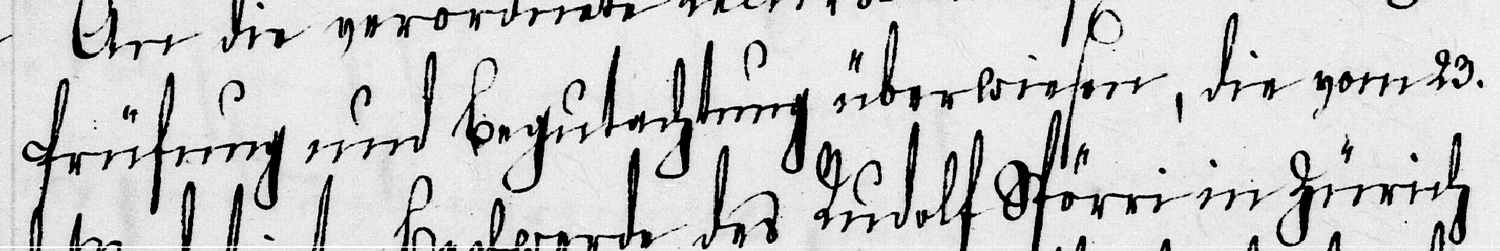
Prüfung und Begutachtung überwiesen, die vom 23.
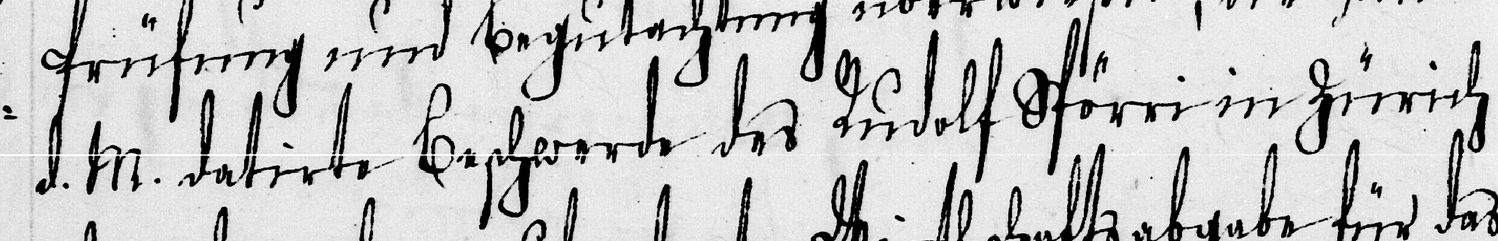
d. M. datirte Beschwerde des Rudolf Spörri in Zürich
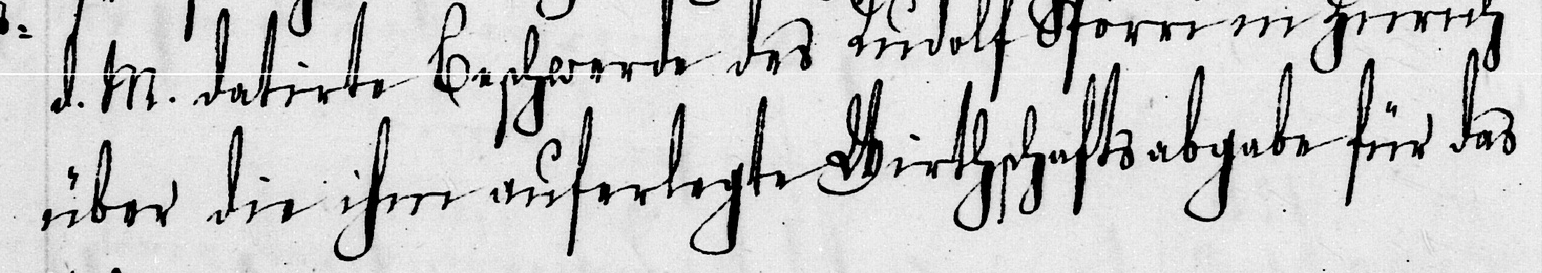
über die ihm auferlegte Wirthschaftsabgabe für das
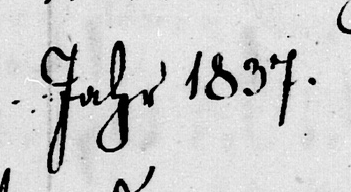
Jahr 1837.
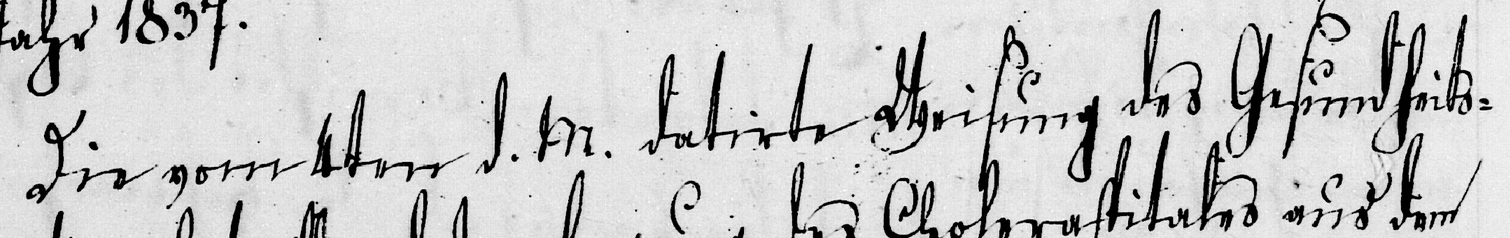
Die vom 4ten d. M. datirte Weisung des Gesundheits¬
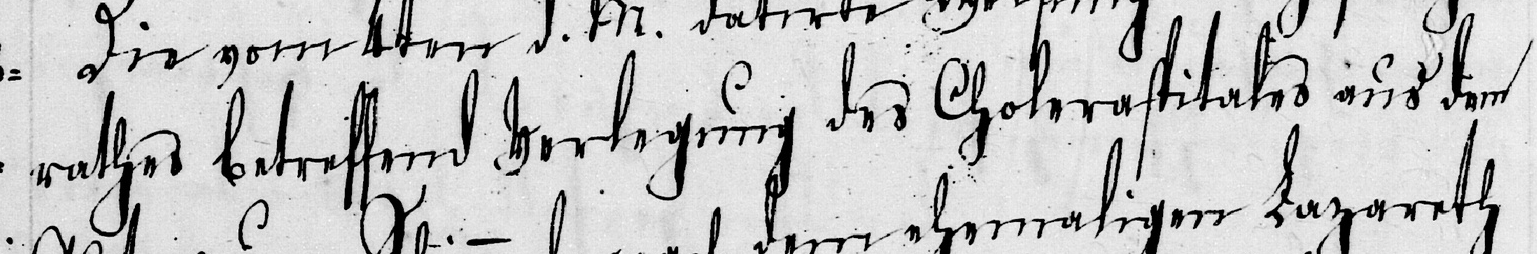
rathes betreffend Verlegung des Choleraspitales aus dem
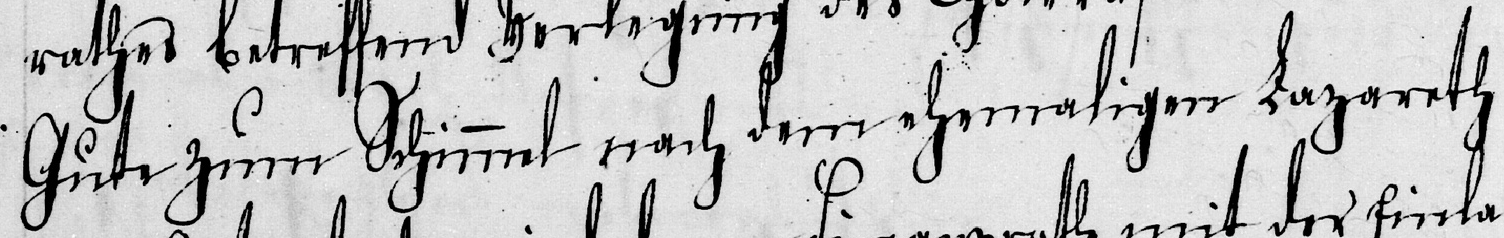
Gute zum Schimmel nach dem ehemaligen Lazareth
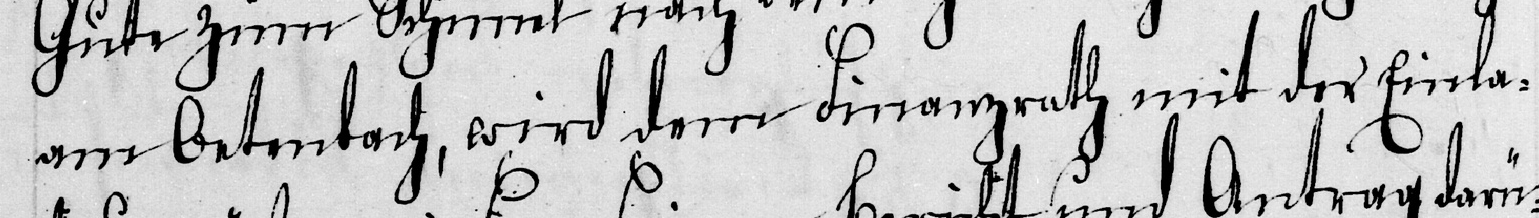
am Oetenbach, wird dem Finanzrath mit der Einla¬
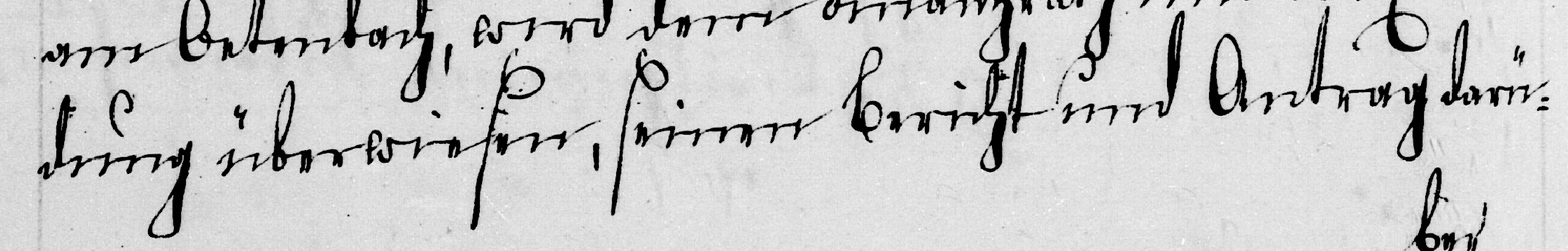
dung überwiesen, seinen Bericht und Antrag darü-
